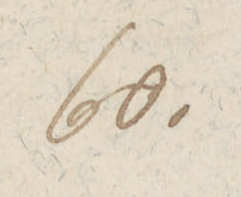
60.
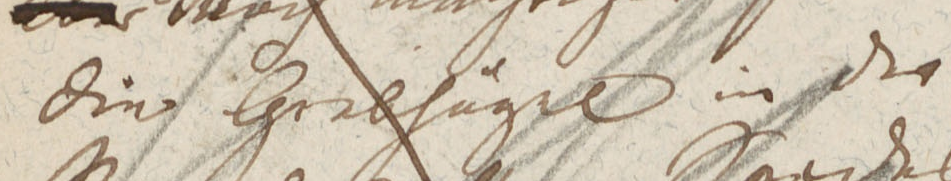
die % bestimmte Typen der
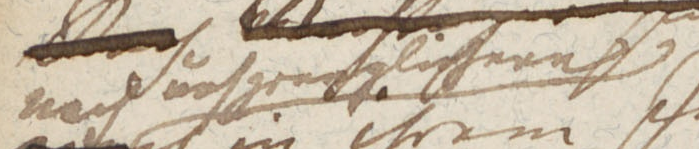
so entschieden barock ist.
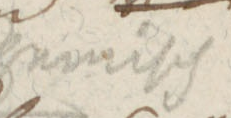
die lydischen
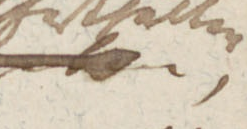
untersuchten
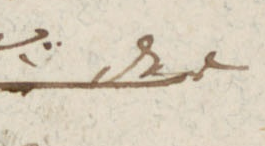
und 5 Denk-
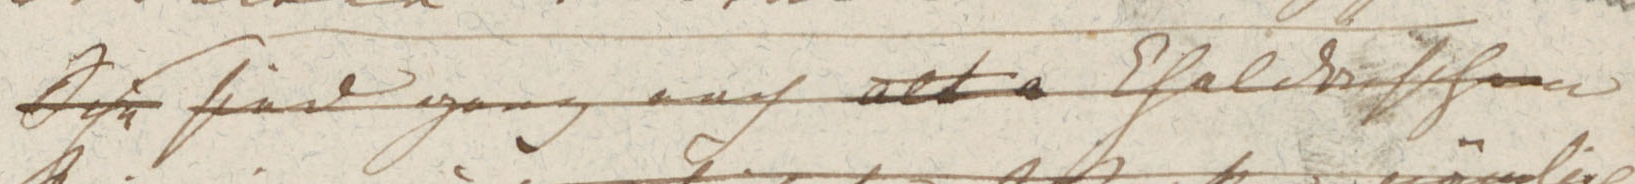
Sie sind ganz nach alt a Chaldaischem
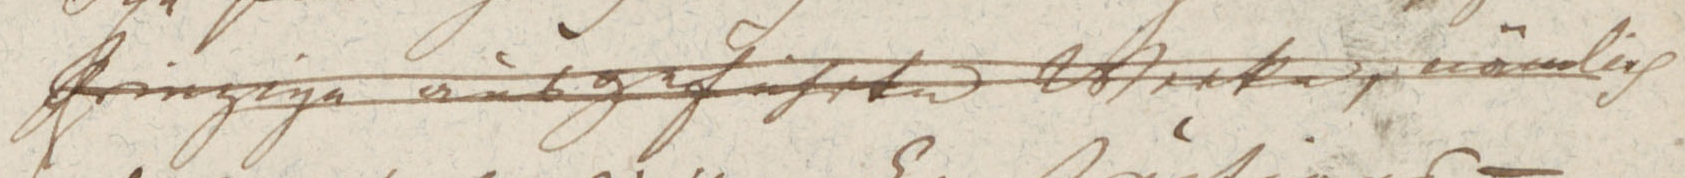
Prinzipe ausgeführte Werke, nämlich
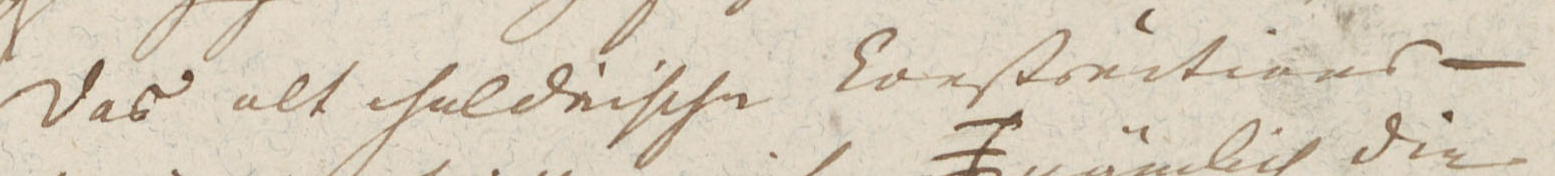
Das alt chaldäische Constructions-
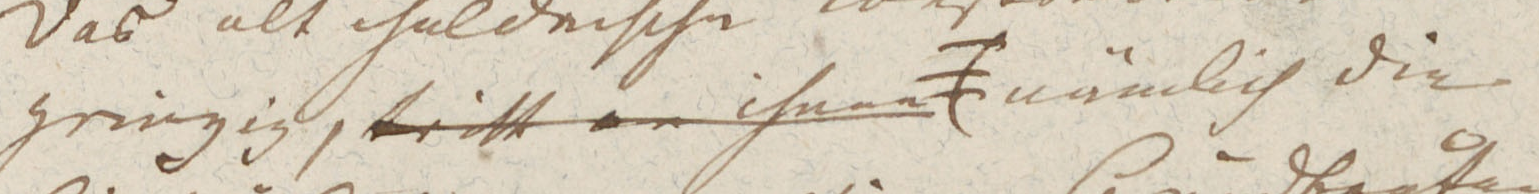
prinzip, tritt an ihnen (nämlich die
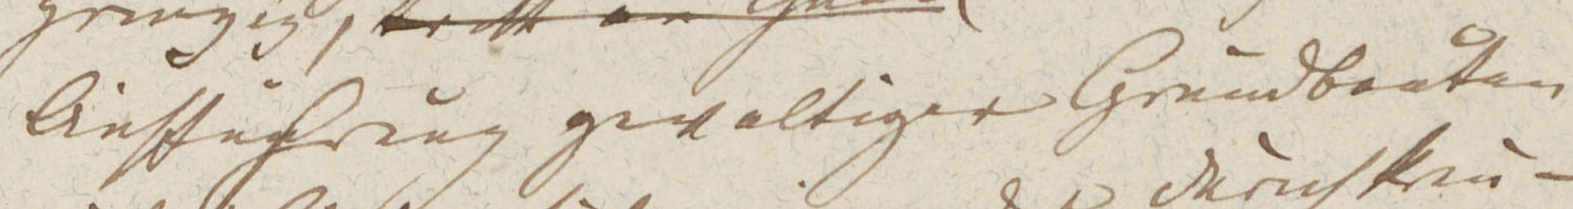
Aufführung gewaltiger Grundbauten
